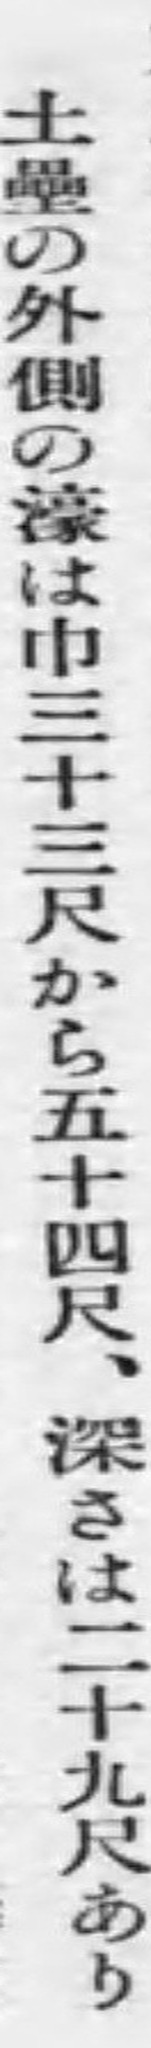土壘の外側の濠は巾三十三尺から五十四尺、深さは二十九尺あり
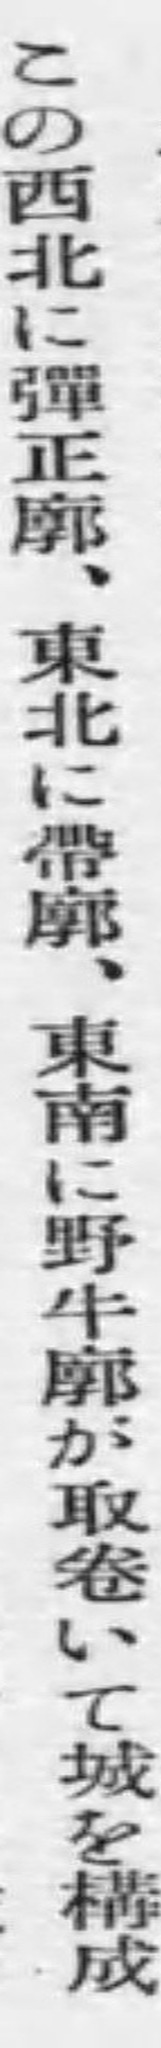この西北に弾正廓、東北に帯廓、東南に野牛廓が取巻いて城を構成
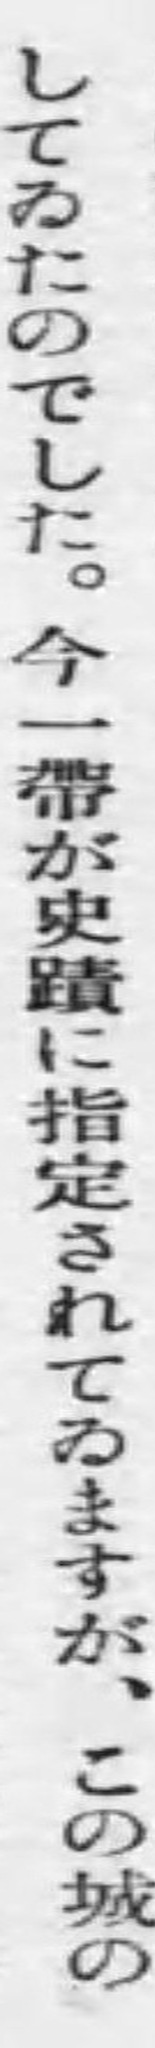してゐたのでした。今一帯が史蹟に指定されてゐますが、この城の
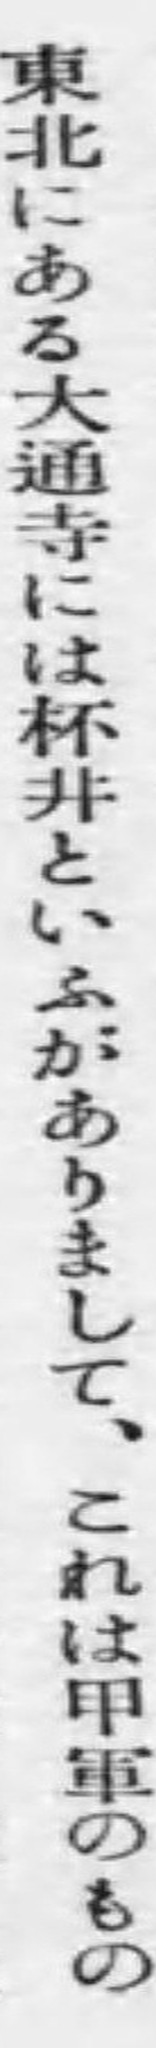東北にある大通寺には杯井といふがありまして、これは甲軍のもの
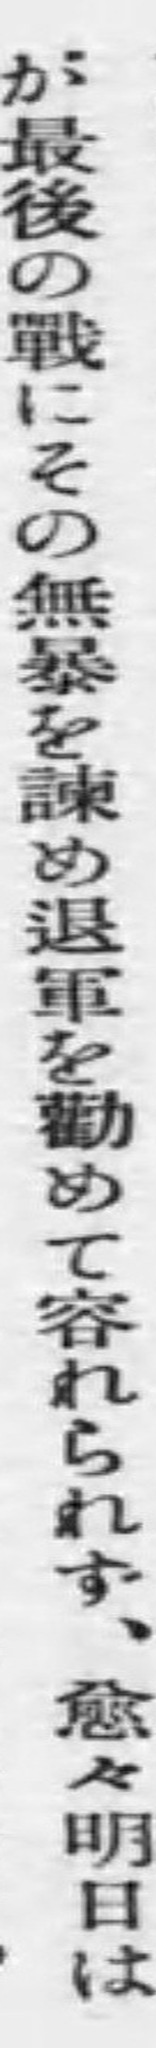が最後の戦にその無暴を諫め退軍を勸めて容れられず、愈々明日は
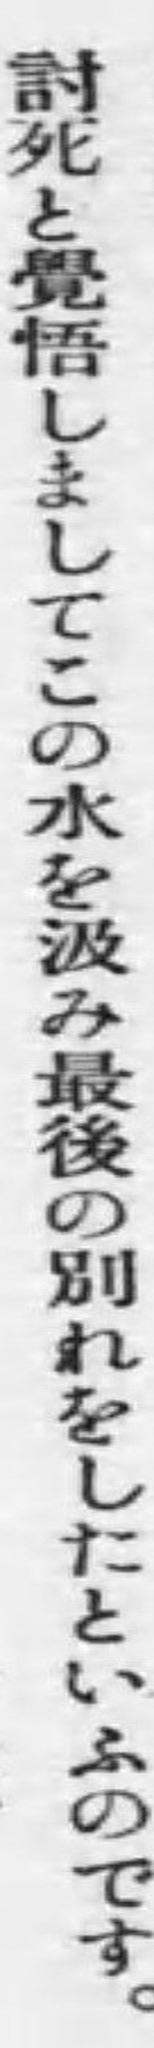討死と覺悟しましてこの水を汲み最後の別れをしたといふのです。

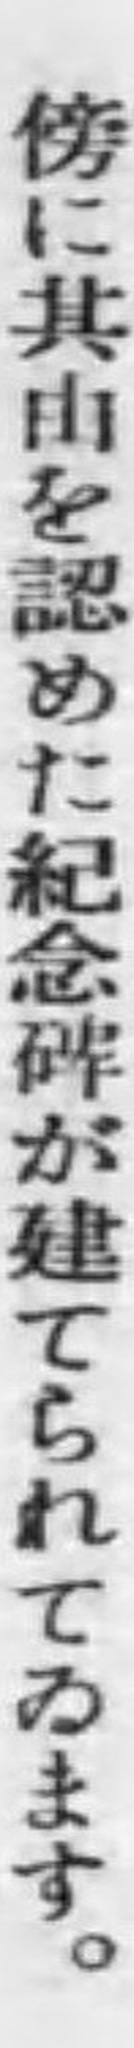傍に其由を認めた紀念碑が建てられてゐます。
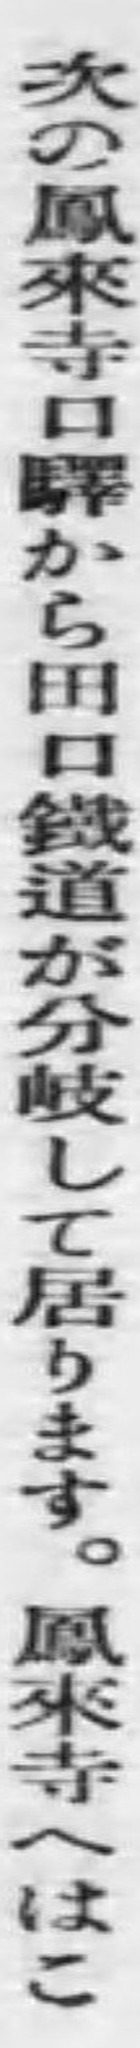次の鳳來寺口驛から田口鐵道に分岐して居ります。鳳來寺へはこ
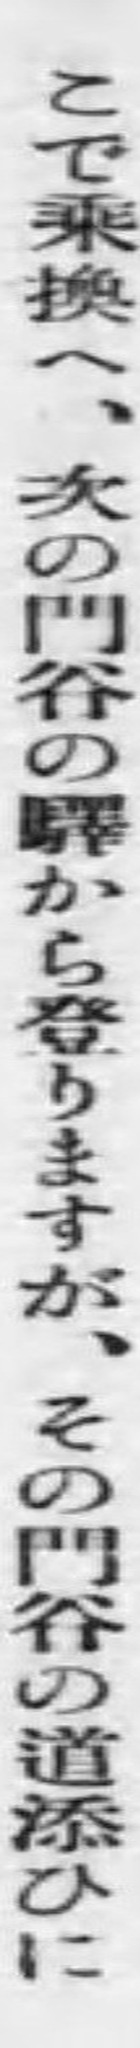こで乗換へ、次の門谷の驛から登りますが、その門谷の道添ひに
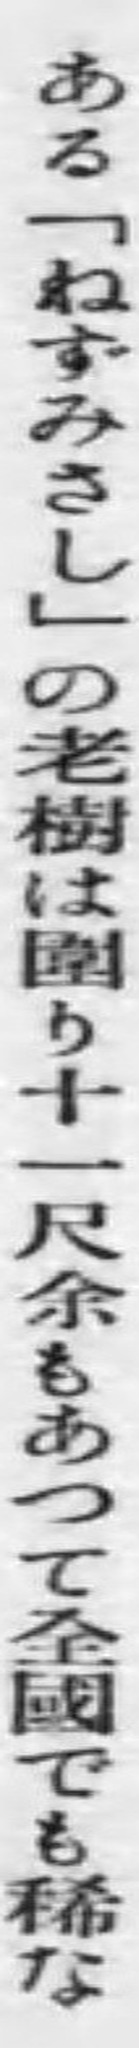ある「ねずみさし」の老樹は圍り十一尺余もあつて全國でも稀な
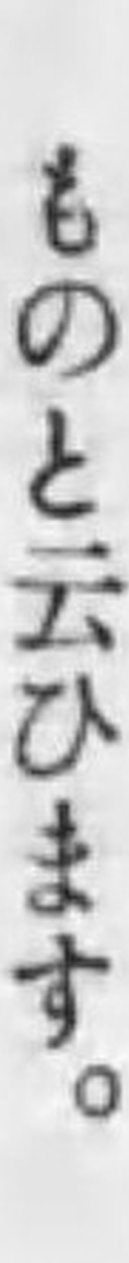ものと云ひます。
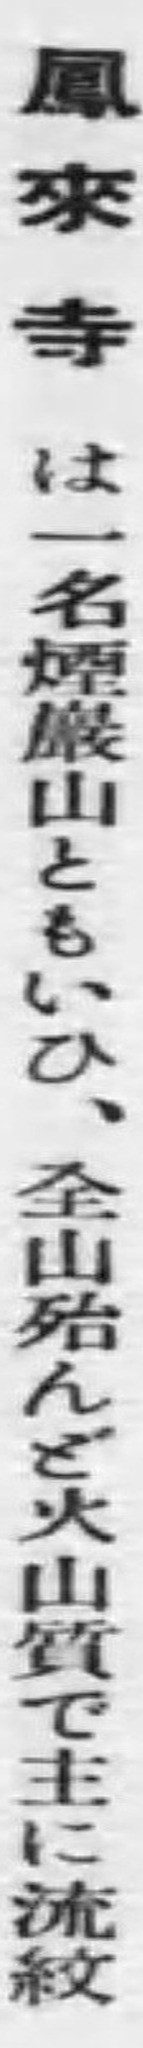鳳來寺は一名煙巖山ともいひ、全山殆んど火山質で主に流紋
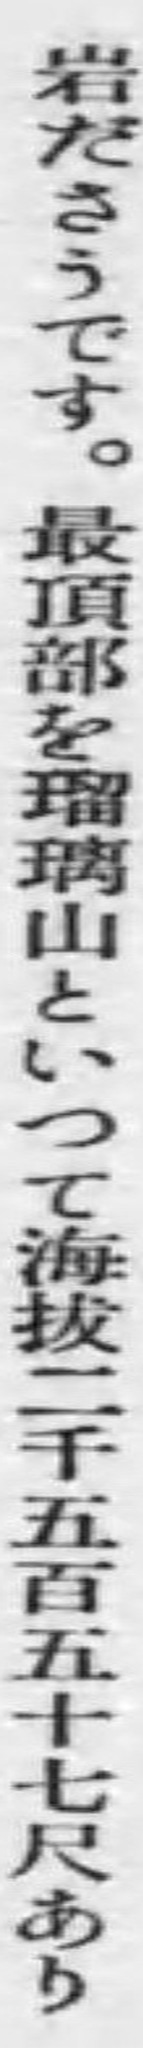岩ださうです。最頂部を瑠璃山といつて海抜二千五百五十七尺あり
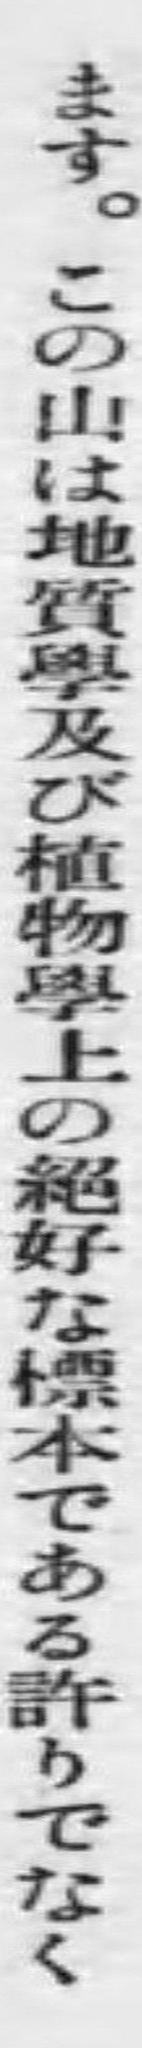ます。この山は地質學及び植物學上の絶好な標本である許りでなく
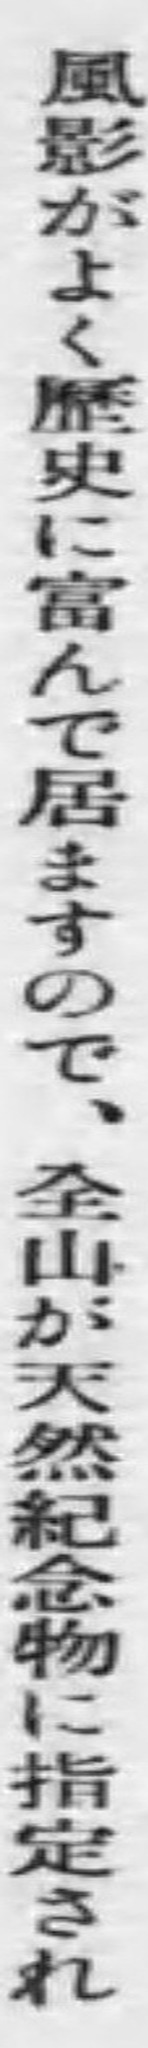風影がよく歴史に富んで居ますので、全山が天然紀念物に指定され
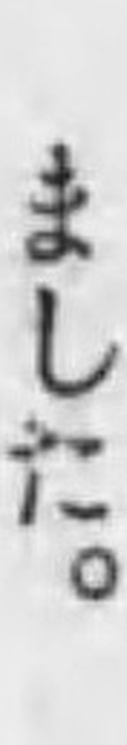ました。
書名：東三河道中記 : 豊橋市及其附近案内
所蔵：国立国会図書館 National Diet Library, JAPAN
